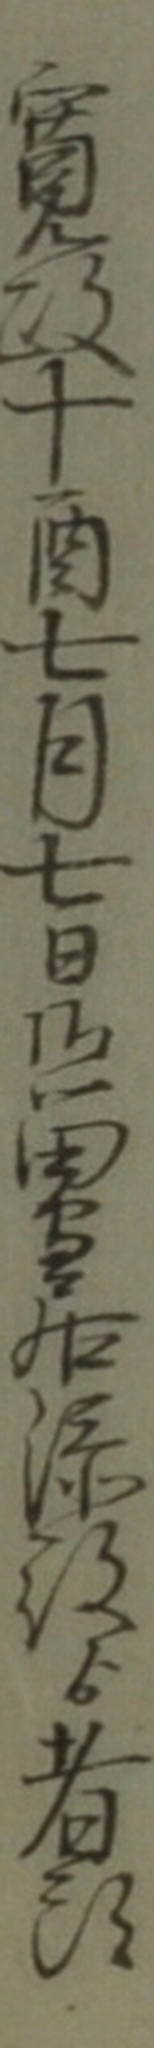一寛政十酉七月七日御留守居添役ゟ者頭
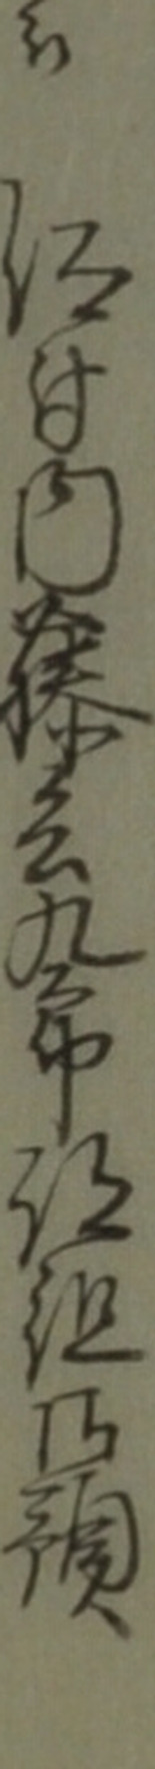被仰付内藤兵九郎跡組御預
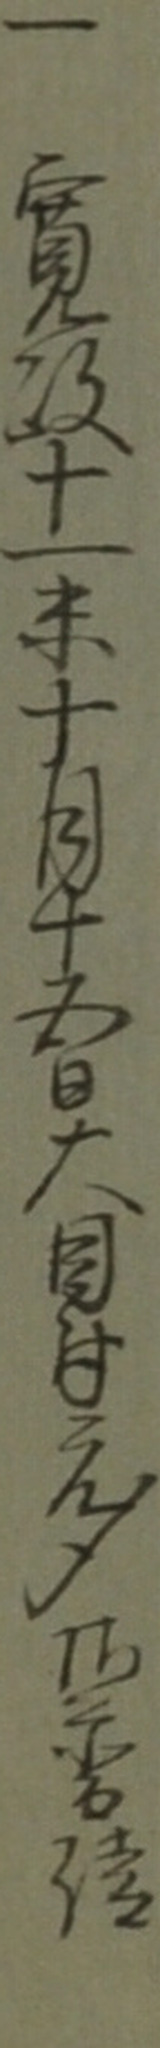一寛政十一未十月十五日大目付元〆御普請
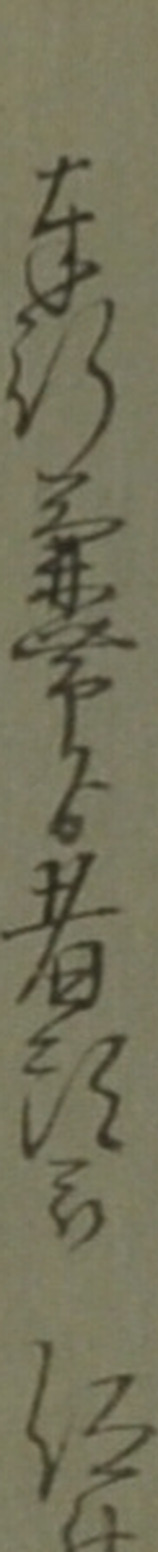奉行兼帯ゟ者頭被仰付
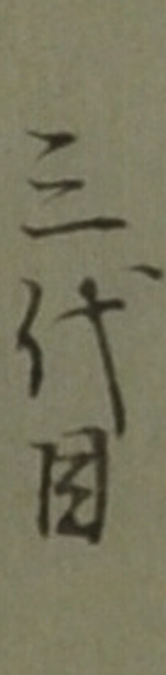三代目
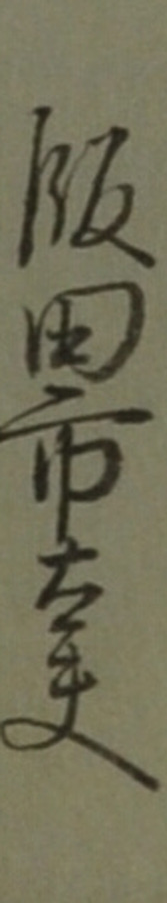飯田市太夫
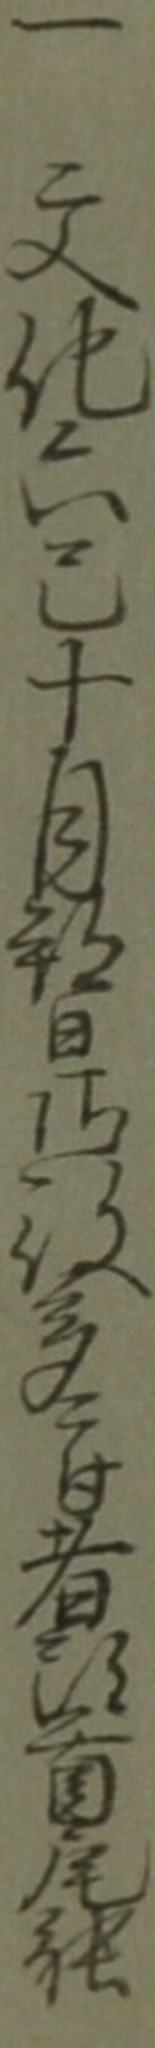一文化六巳十月朔日御役多ニ付者頭首尾能
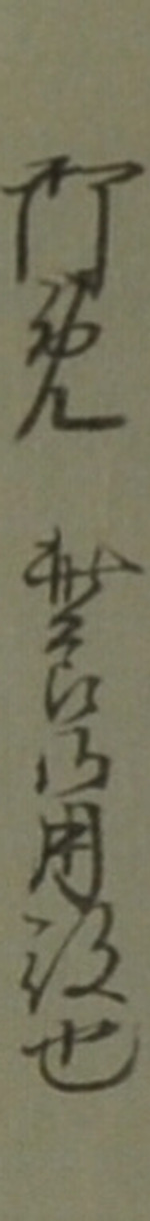御免此節御用役也
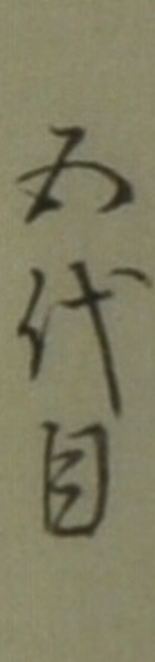五代目

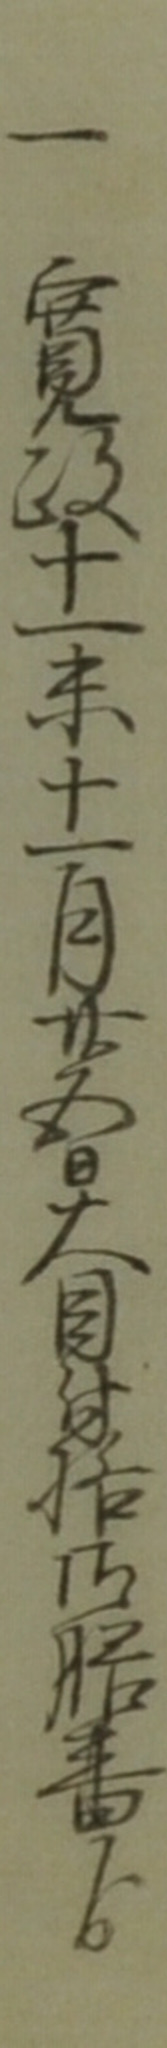一寛政十一未十一月廿五日大目付格御膳番ゟ
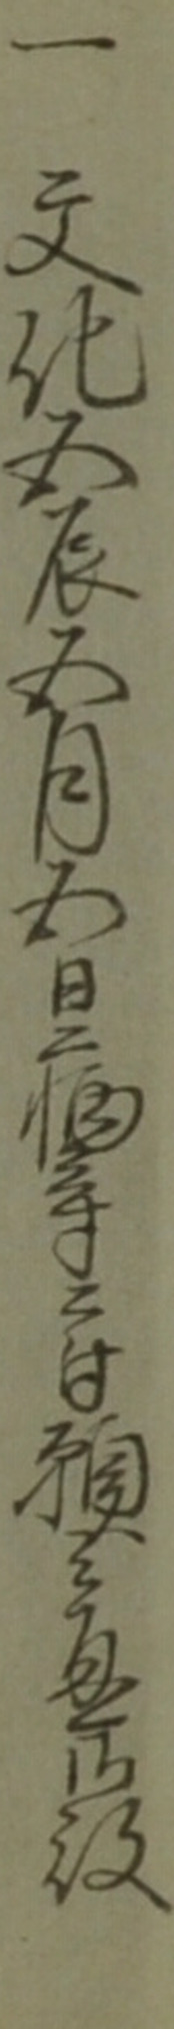一文化五辰五月五日病気ニ付願之通御役
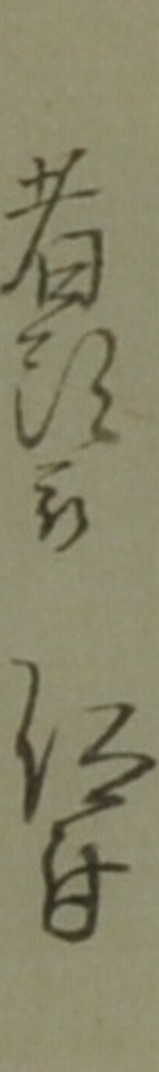者頭被仰付
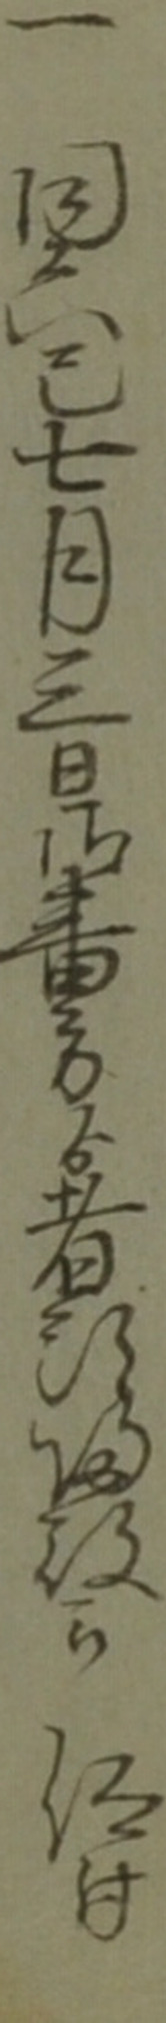一同六巳七月三日御番方ゟ者頭帰役被仰付
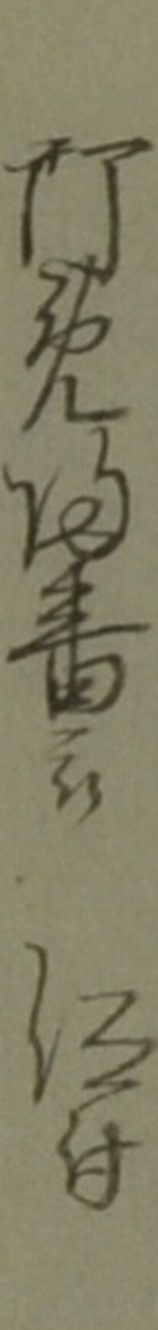御免帰番被仰付
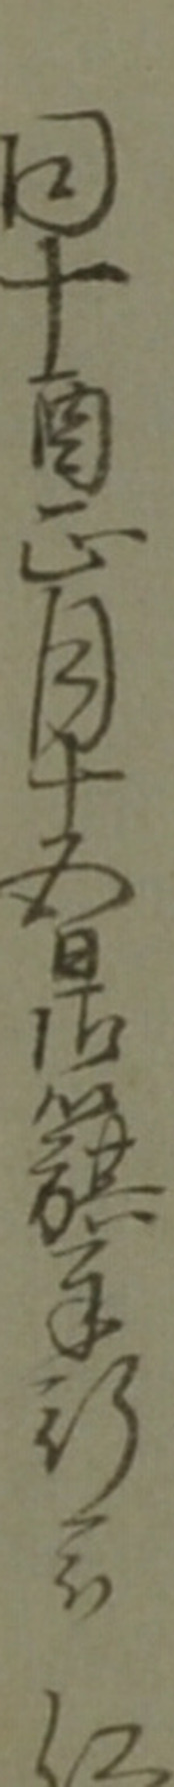一同十酉正月十五日御籏奉行被仰付
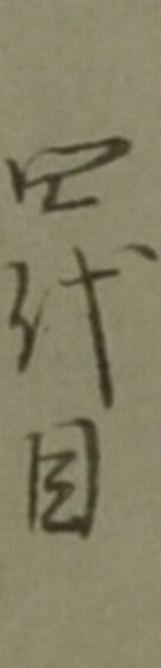四代目
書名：諸御役代々録（二）
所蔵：伊那市立高遠町図書館・合同会社AMANE
